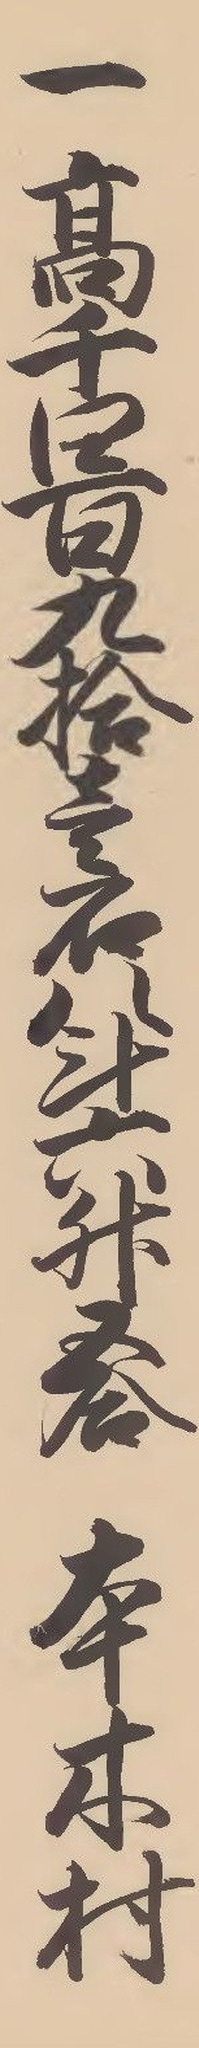一高千四百九拾壱石八斗六升五合本木村
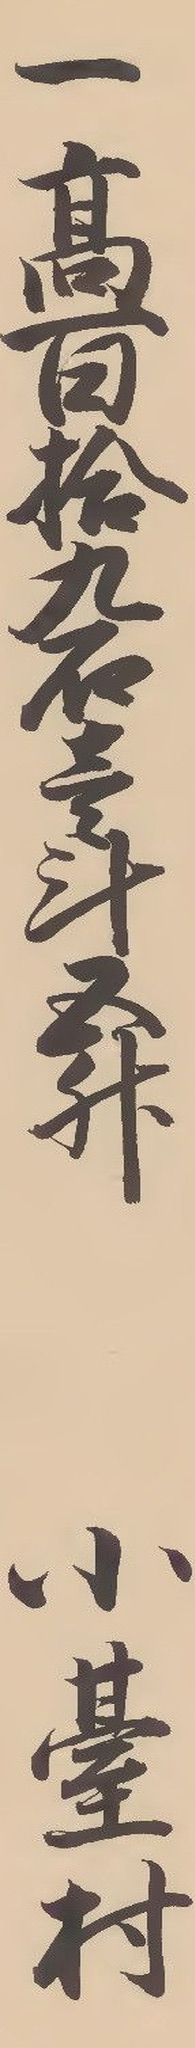一高百拾九石壱斗五升小台村
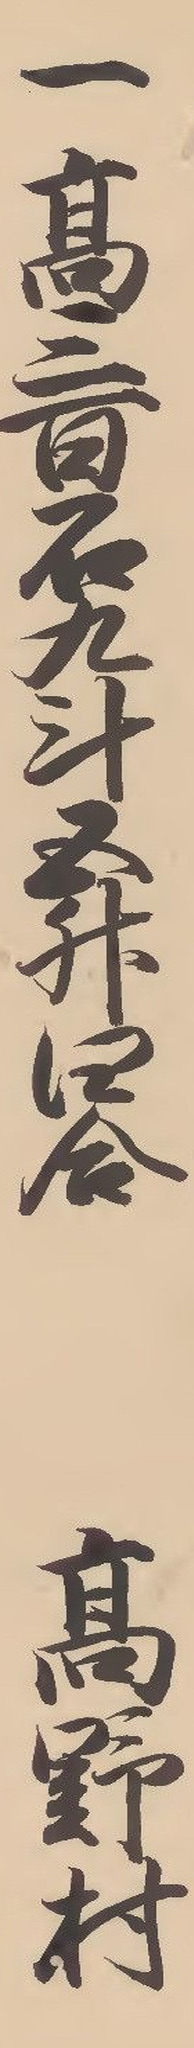一高三百石九斗五升四合高野村
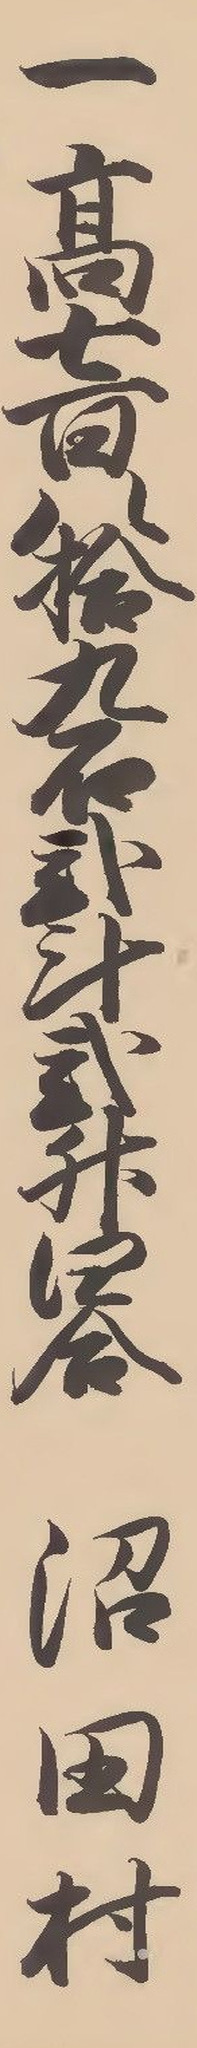一高七百八拾九石弐斗弐升四合沼田村
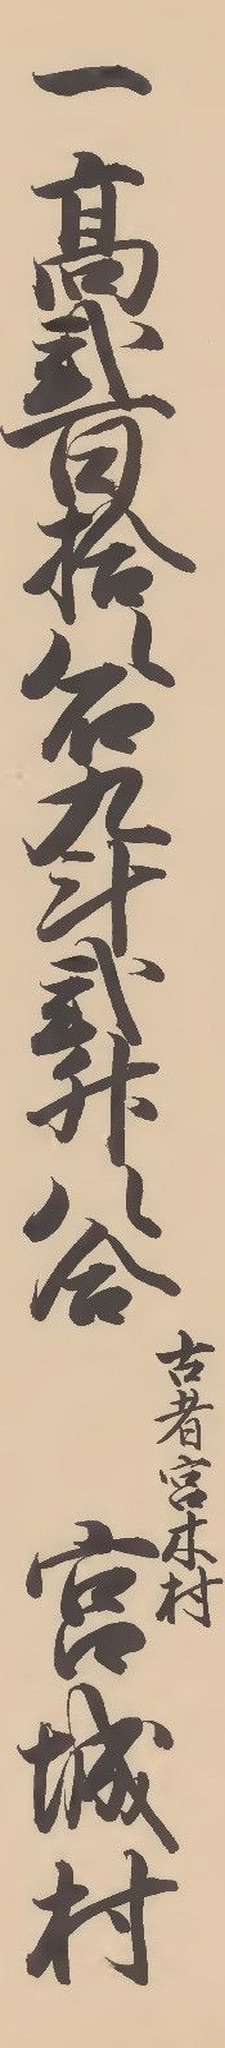一高弐百拾八石九斗弐升八合宮城村
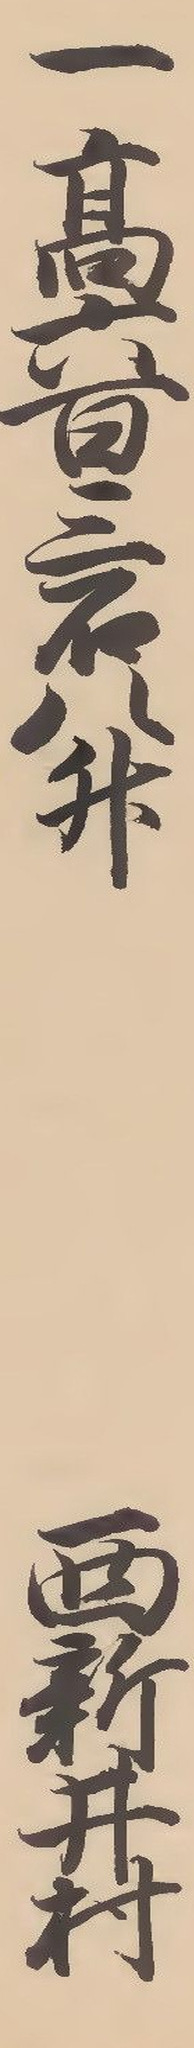一高六百三石八升西新井村
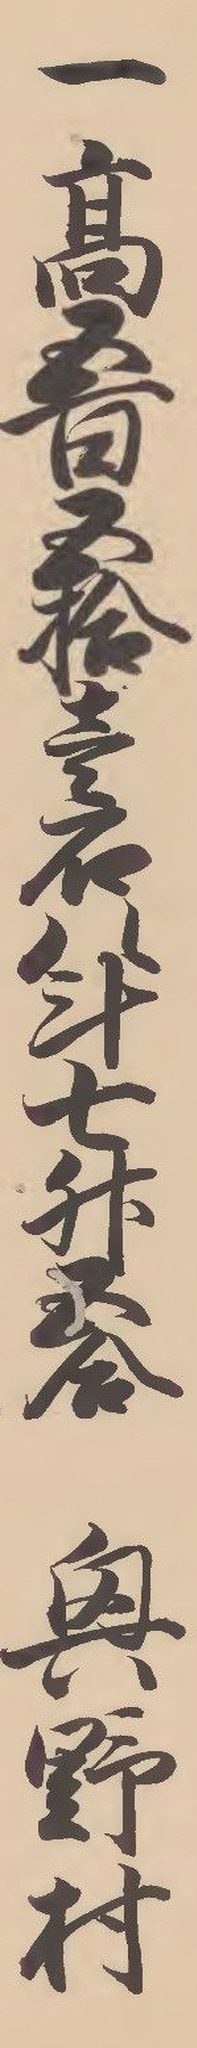一高五百五拾壱石八斗七升五合興野村

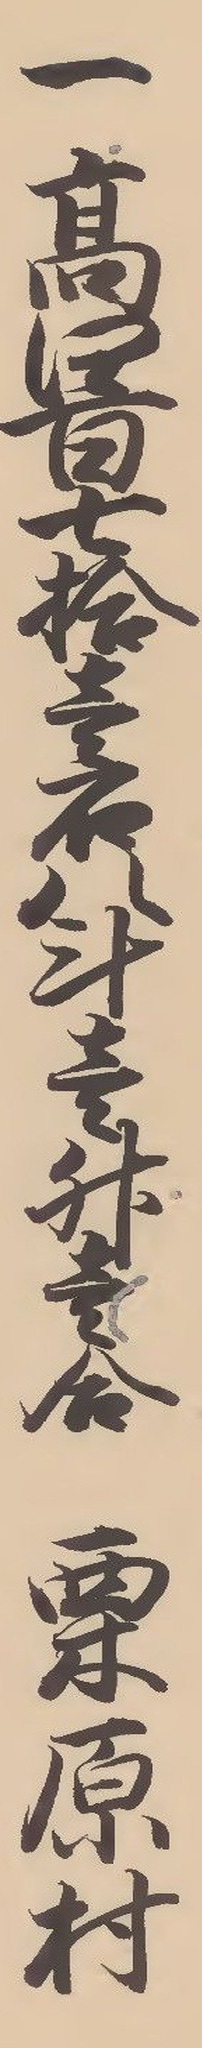一高四百七拾壱石八斗壱升壱合栗原村
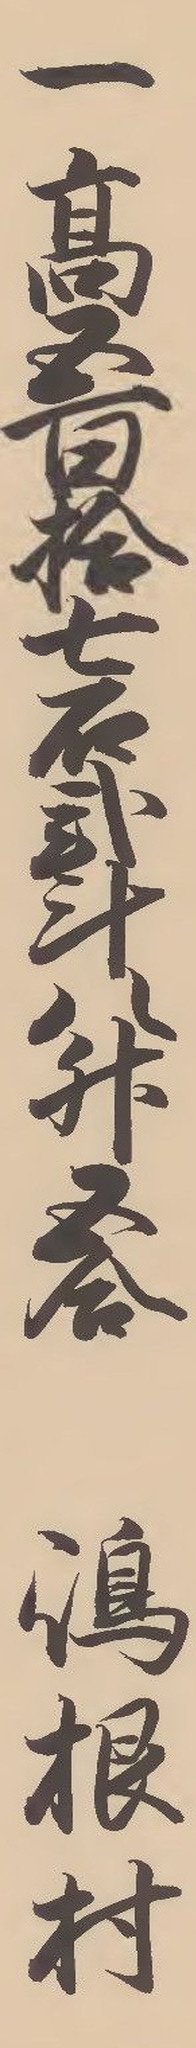一高五百拾七石弐斗八升五合嶋根村
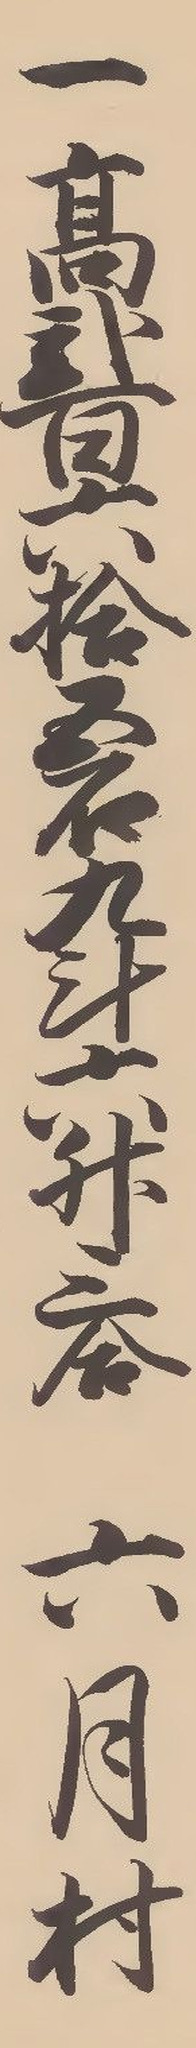一高弐百六拾五石九斗六升三合六月村
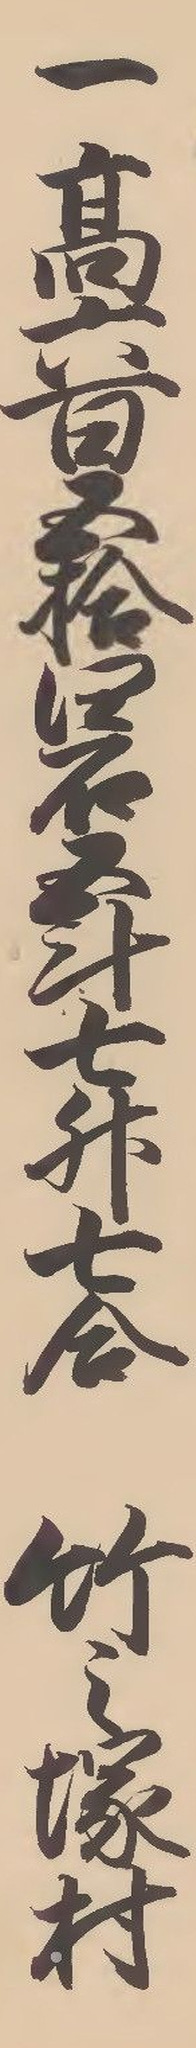一高六百五拾四石五斗七升七合竹之塚村
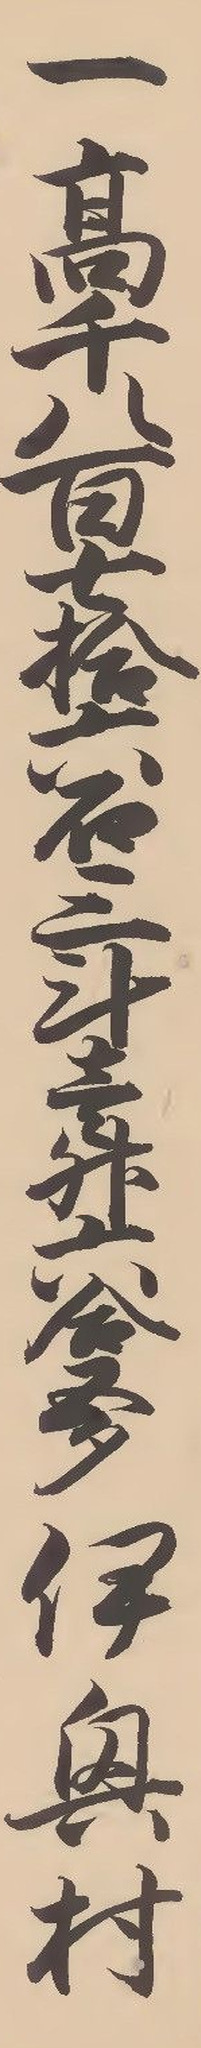一高千八百七拾六石三斗壱升六合五勺伊興村
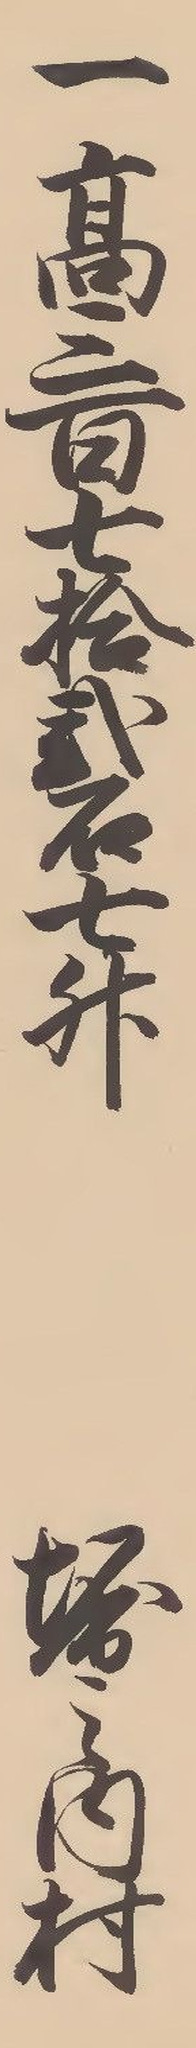一高三百七拾弐石七升堀之内村
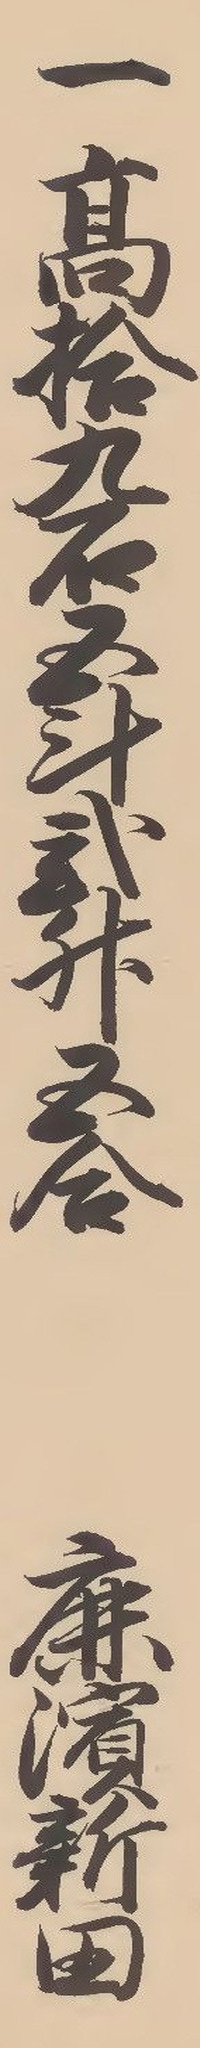一高拾九石五斗弐升五合鹿濱新田
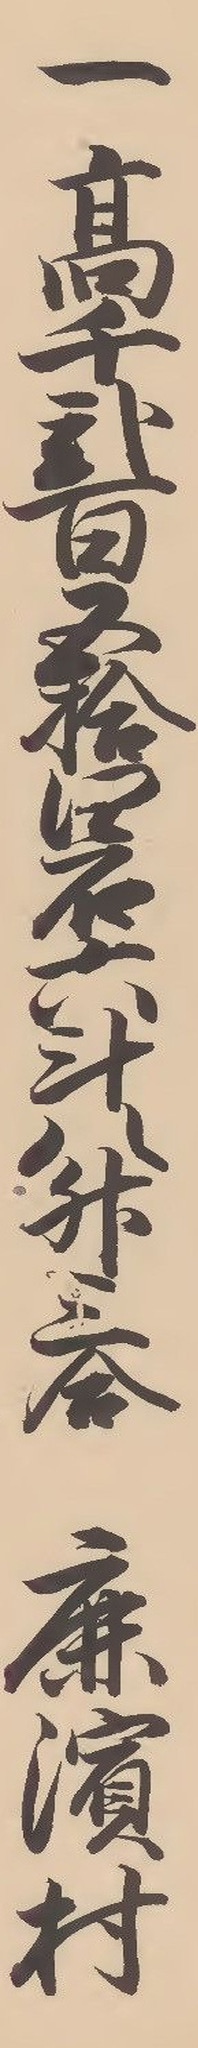一高千弐百五拾四石六斗八升三合鹿濱村

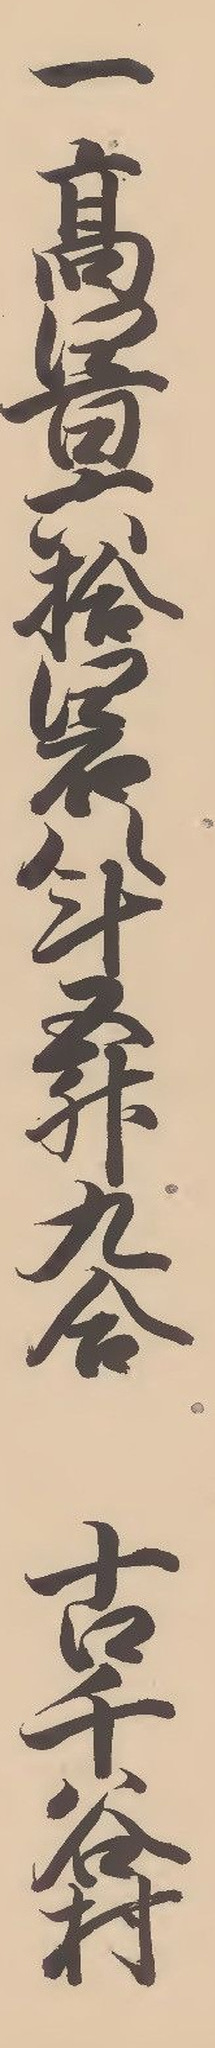一高四百六拾四石八斗五升九合古千谷村
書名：武蔵国郷帳　下
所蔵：国立公文書館 National Archives of Japan
